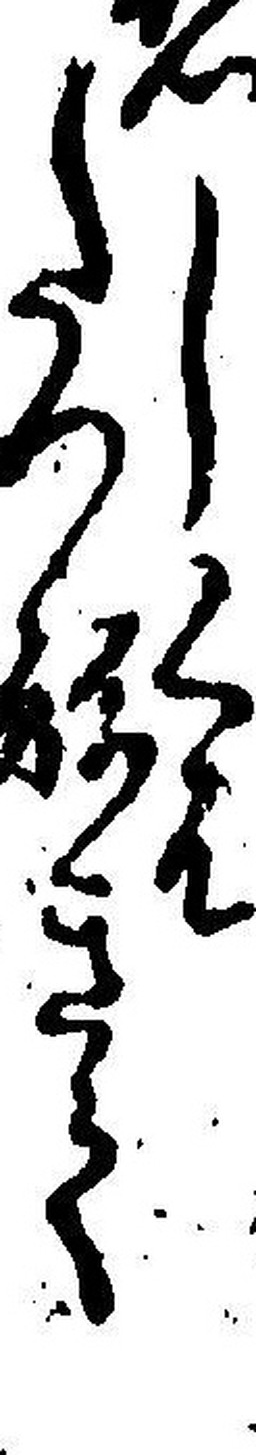たつねきて
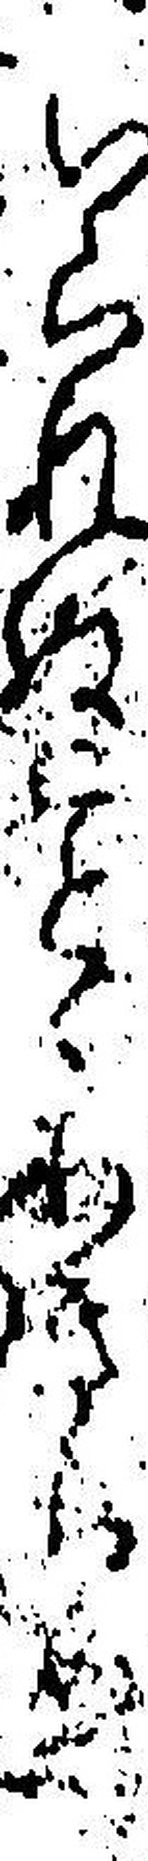いられぬことゝあきらめ
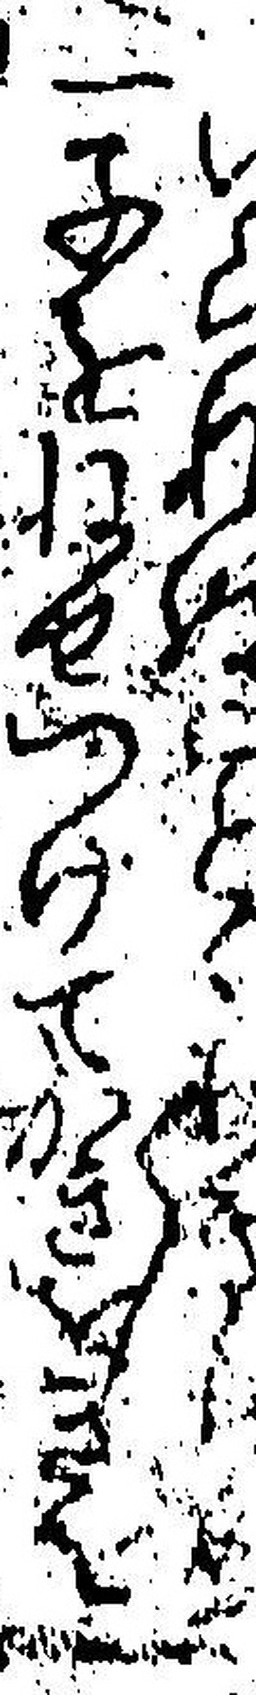一子をねせつけてかきをきを
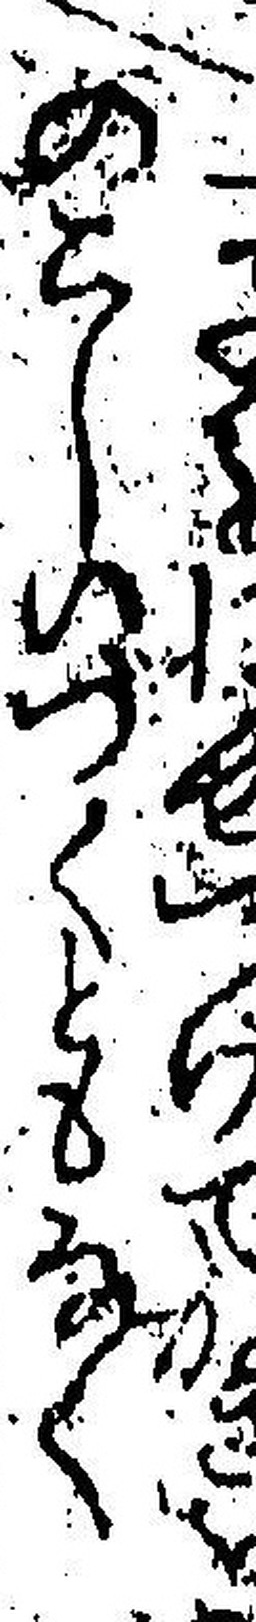のこしいづくともなく
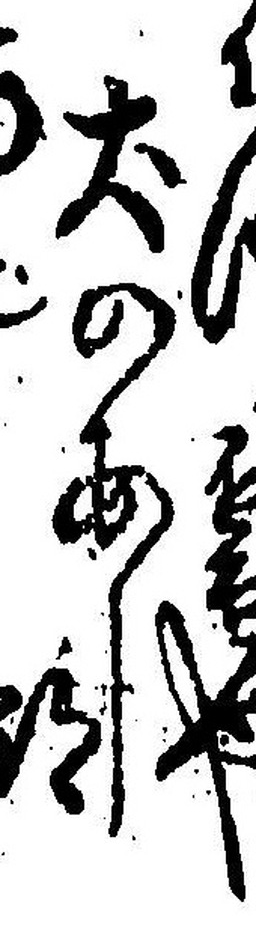犬のあし
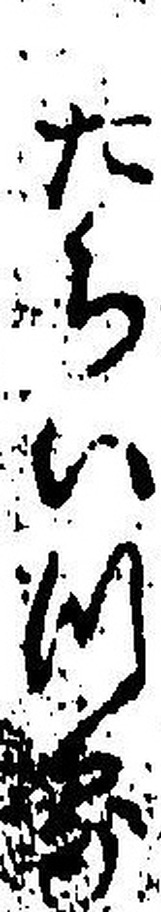たちいつる
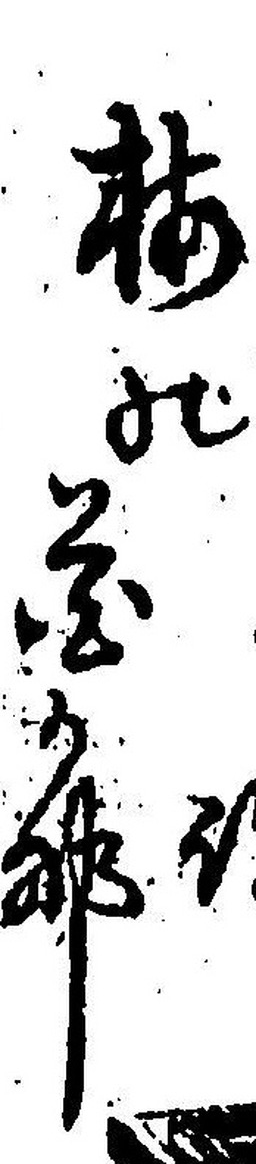梅の花かな
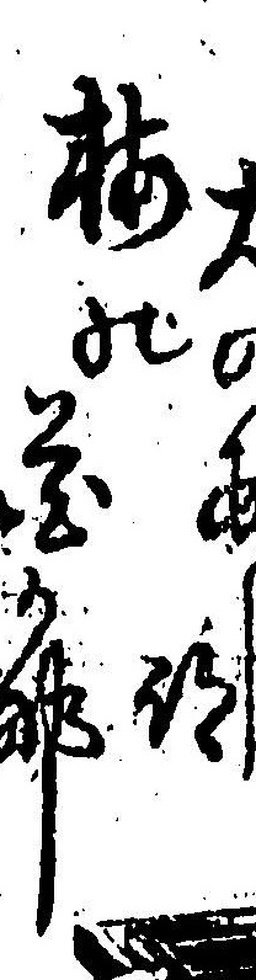梅の花かな
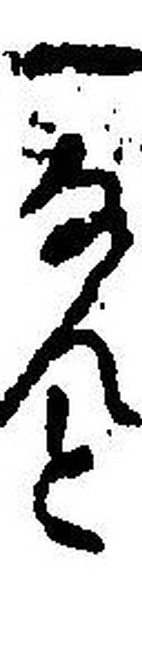なんと
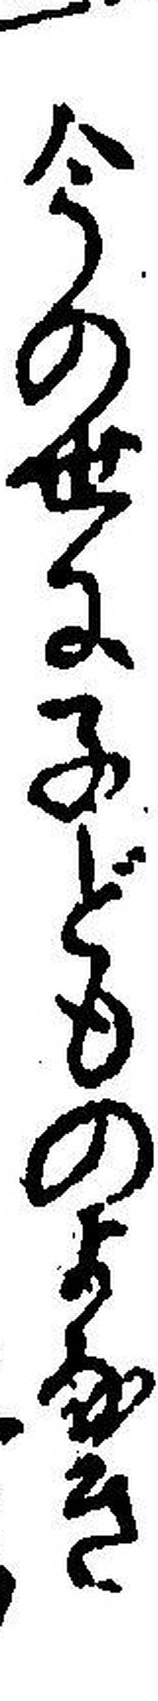今の世に子どものよなき
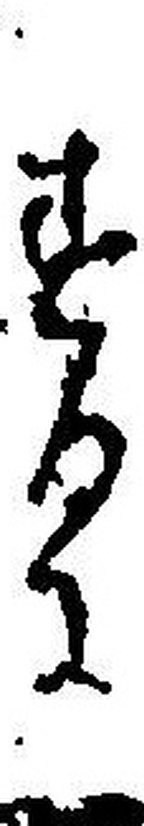するに
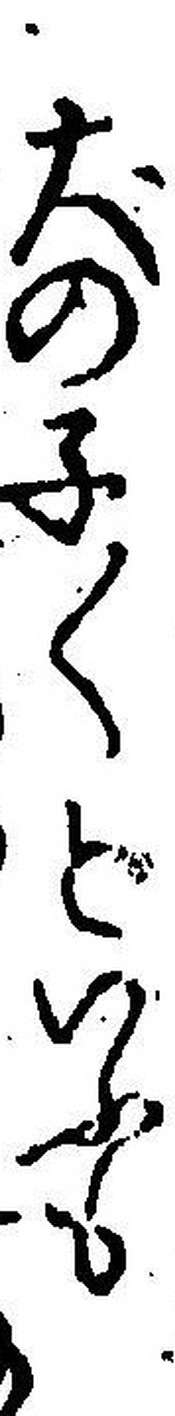犬の子〳〵といふも
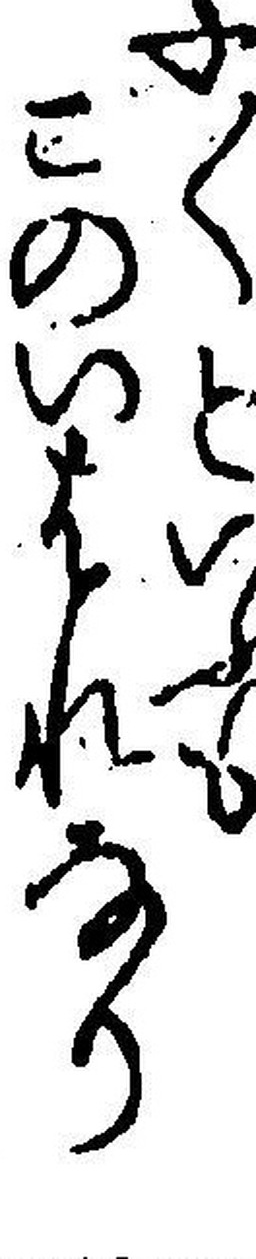このいはれなり
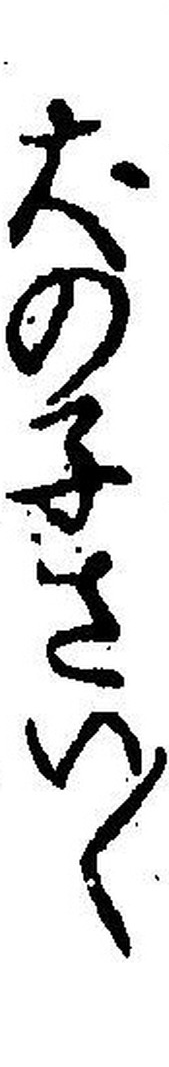犬の子さい〳〵
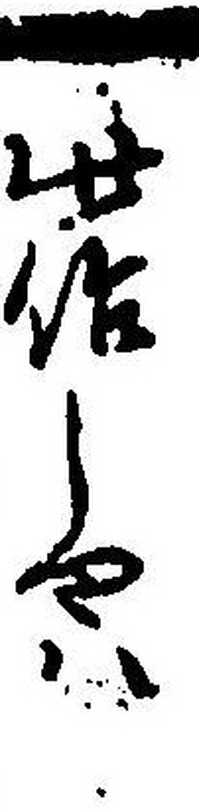此作しやは
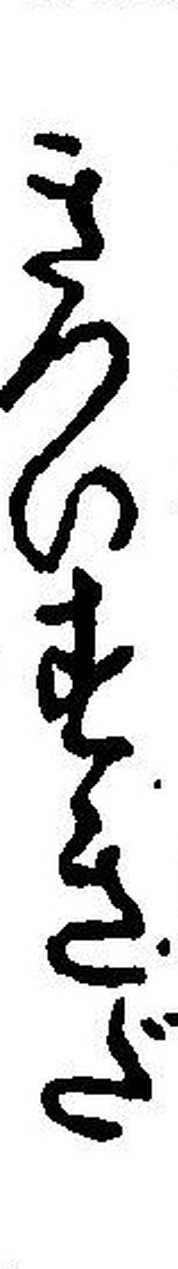きついすきだ
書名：花芳野犬斑 / 山東京伝作
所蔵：東京大学総合図書館 General Library in the University of Tokyo, JAPAN
